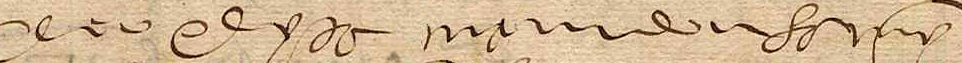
e leo e lyta mamdou ha mȳ
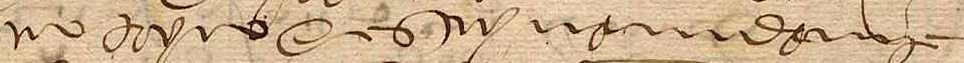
notayro e escryuam damte
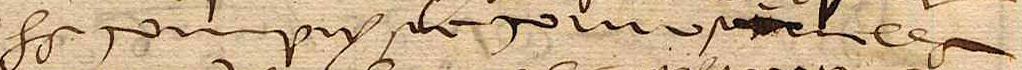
ha compryse como se_nella
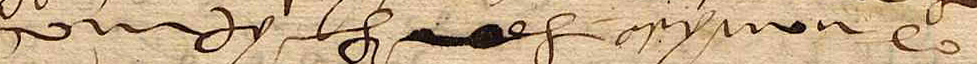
comtynha e lhe asynou lo
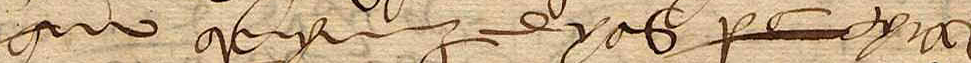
guo quynze dyas ꝑa tyrar
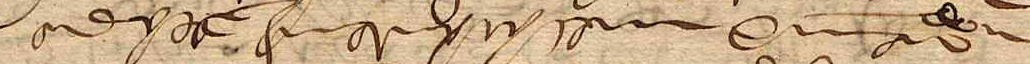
a dyta Jnquyrcam e mãodou
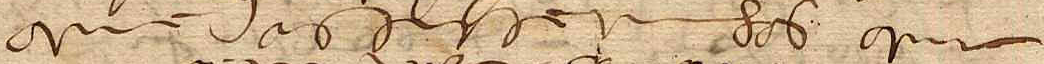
que as testemhas que
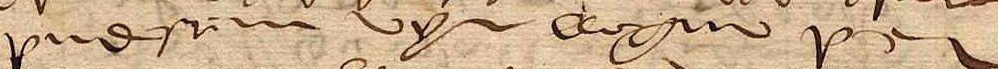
pudesem vyr lloguo per
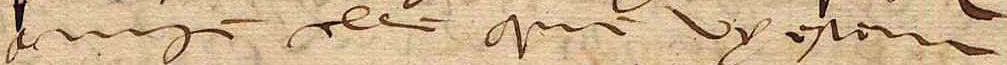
amte elle que vyesem
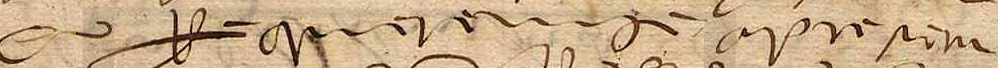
e o Requeremte apresem
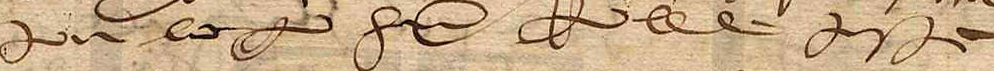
tou logo hū Roll de teste
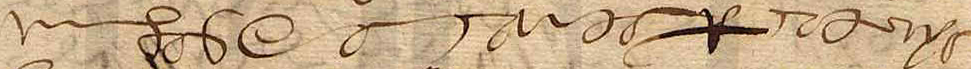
muhas e a carta ꝑcatorya
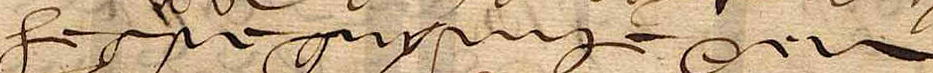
he a seguymte e eu
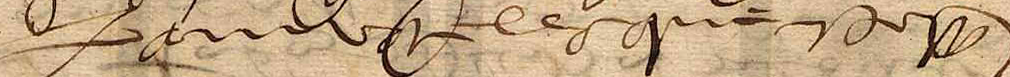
Joam varella que esto sp̄j
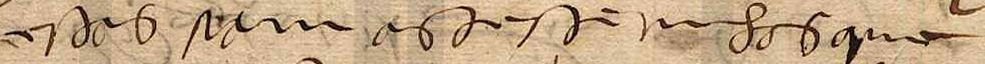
estas sam as testemhas que
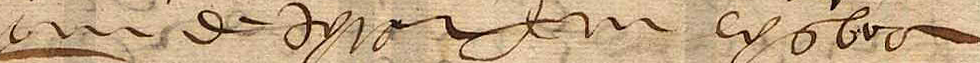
am de tyrar Em lysboa
